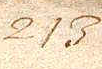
213
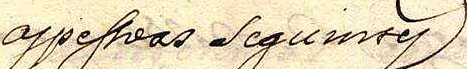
as pessoas seguintes
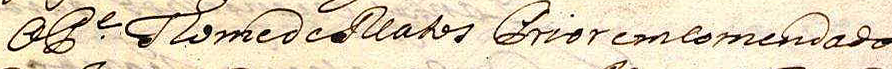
o P.e Thome de Matos Prior emcomendado
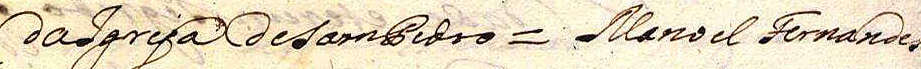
da Igreja de sam Pedro = Manoel Fernandes
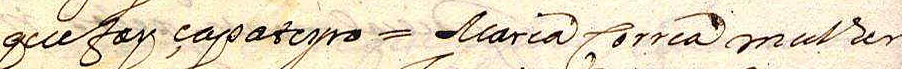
que foy çapateyro = Maria Correa mulher
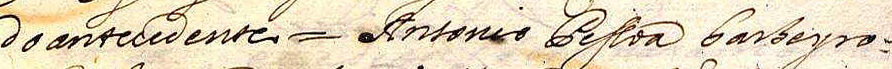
do antecedente = Antonio Pessoa barbeyro =
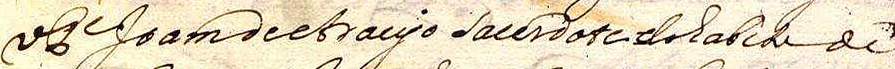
o Pe Joam de Araujo sacerdote do habito de
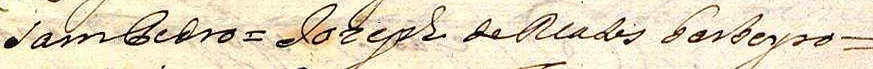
sam Pedrov= Iozeph de Matos barbeyro =
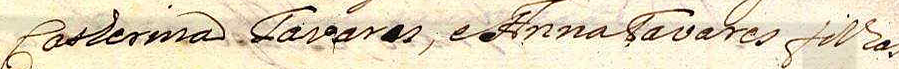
Catherina Tavares, e Anna Tavares filhas
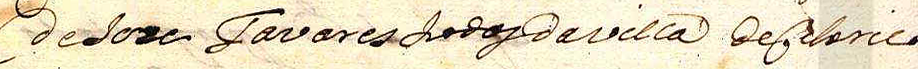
de Ioze Tavares todos da villa de Celorico.
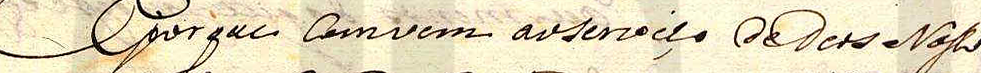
E porque comvem ao serviço de deos Nosso
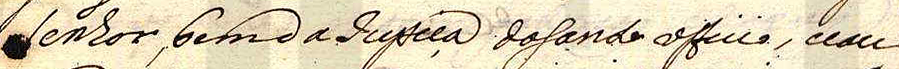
senhor, bem da Iustiça do santo officio, cau
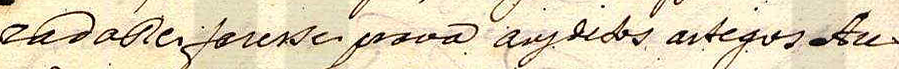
za da Re fazerse prova aos ditos artigos Au
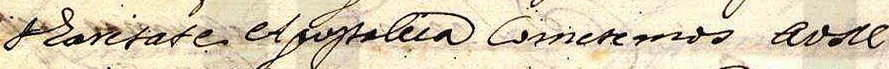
thoritate Apostolica Cometemos a VM
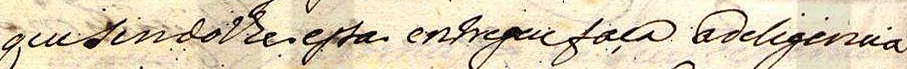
que sendolhe esta entregue faça a deligencia
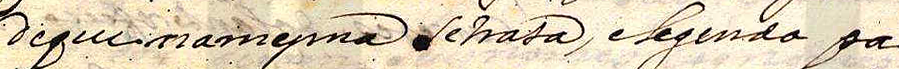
de que na mesma se trata, elegendo pa
